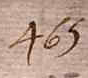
465
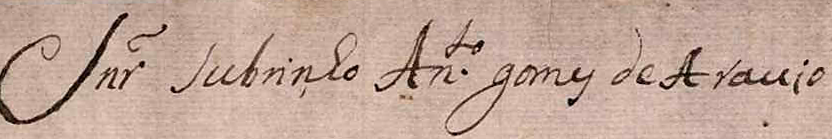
Snr̄ subrinho An.to gomes de Arauio
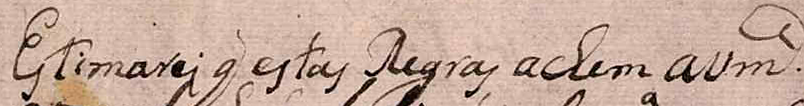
Estimarei q̄ estas Regras achem a vm.ce
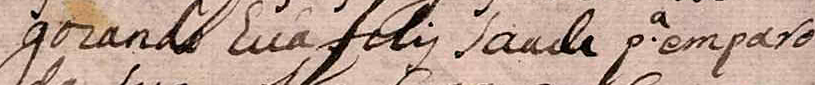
gozando huā felis saude p.a emparo
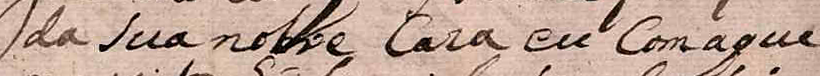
da sua nobre Caza eu Com a que
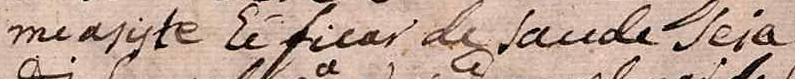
me asiste hé ficar de saude seia
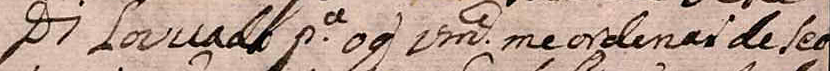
Ds̄ Louuado p.a o q̄ v m.ce me ordenar de seo
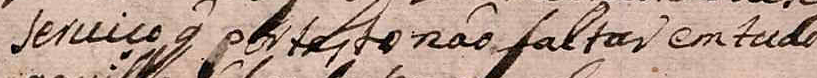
seruiço q̄ portesto naõ faltar em tudo
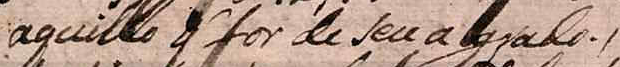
aquillo q̄ for de seu agrado./
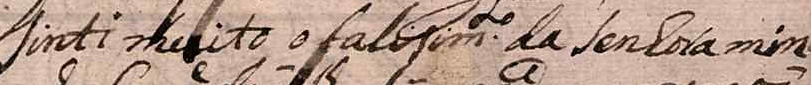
sinti muito o falisim.to da Senhora min
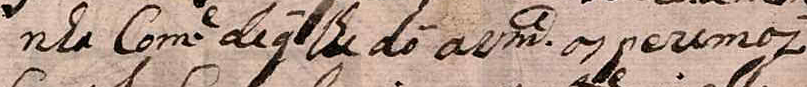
nha Com.e de q̄ lhe dó a vm.ce os pezemoz
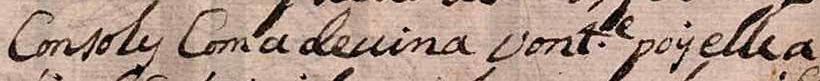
Consoles Com a deuina vont.e pois elle a
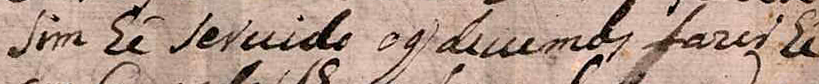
sim hé seruido o q̄ deuemos fazer hé
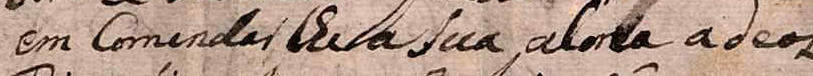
emComendarlhe a sua alma a deoz
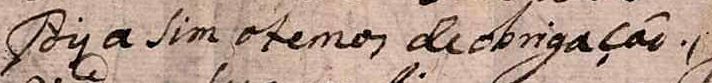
Pois asim o temos de obrigaçaõ./
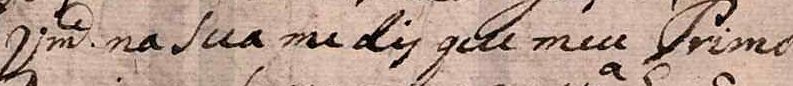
Vm.ce na sua me dis que meu Primo
